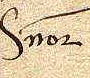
Sn̄or
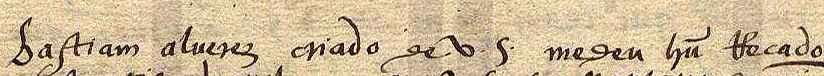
bastiam aluerez criado de V. s. me deu hū Recado
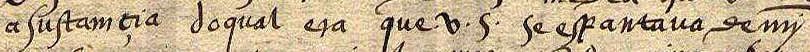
a sustancia do qual era que V. s. se espantaua de mȳ
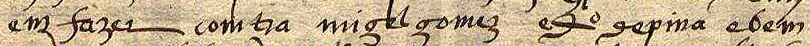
em fazer comtra migel gomez e do de pina e bem
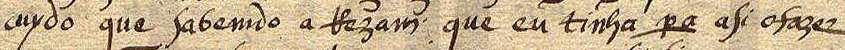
cuydo que sabemdo a Rezam que eu tinha ꝑa asi o fazer
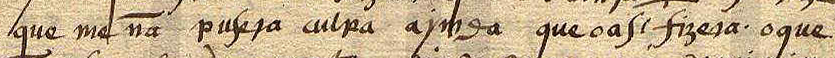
que me nā pusera culpa aynda que o asi fizera. o que
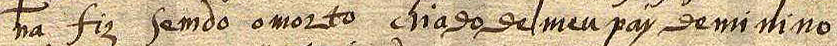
nā fiz semdo o morto criado de meu pay de minino
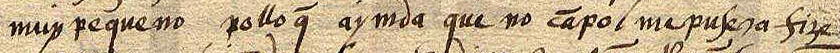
muy pequeno pollo q̄ aymda que no cāpo me pusera fize
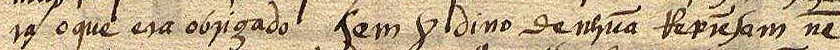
ra o que era obrigado sem ꞩ dino de nhūa Reprēsam nē
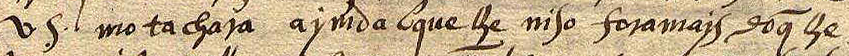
V. s. mo tachara aynda que lhe niso fora mays do q̄ lhe
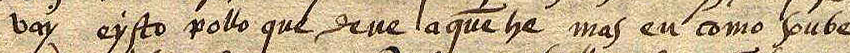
vay e ysto pollo que deue a quē he mas eu como soube
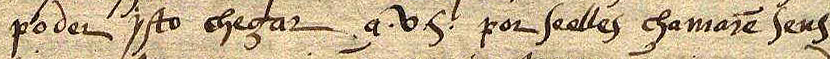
poder ysto chegar a V. s. por se elles chamarē seus
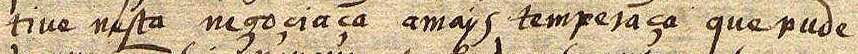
tiue nesta negociaçā a mays temperaça que pude
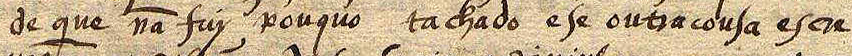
de que nā fuy pouquo tachado e se outra cousa escre
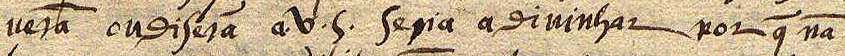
uerā ou diserā a V. s. seria a diuinhar por q̄ n̄a
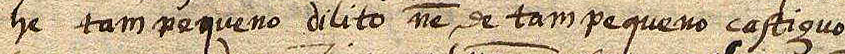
he tam pequeno dilito n̄e de tam pequeno castiguo
